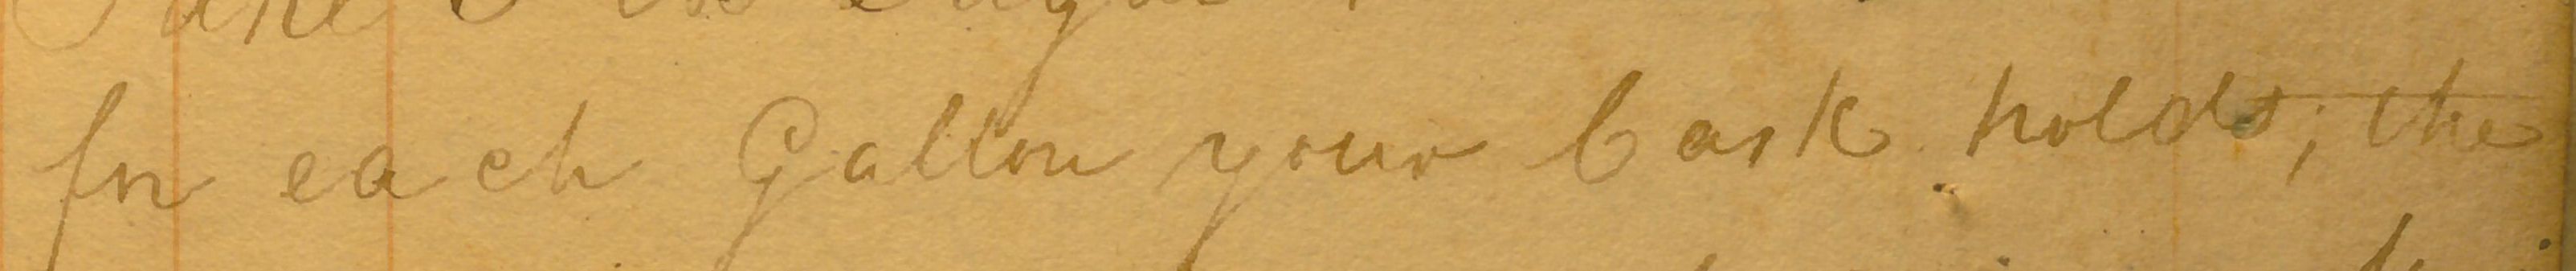for each Gallon your Cask holds; the
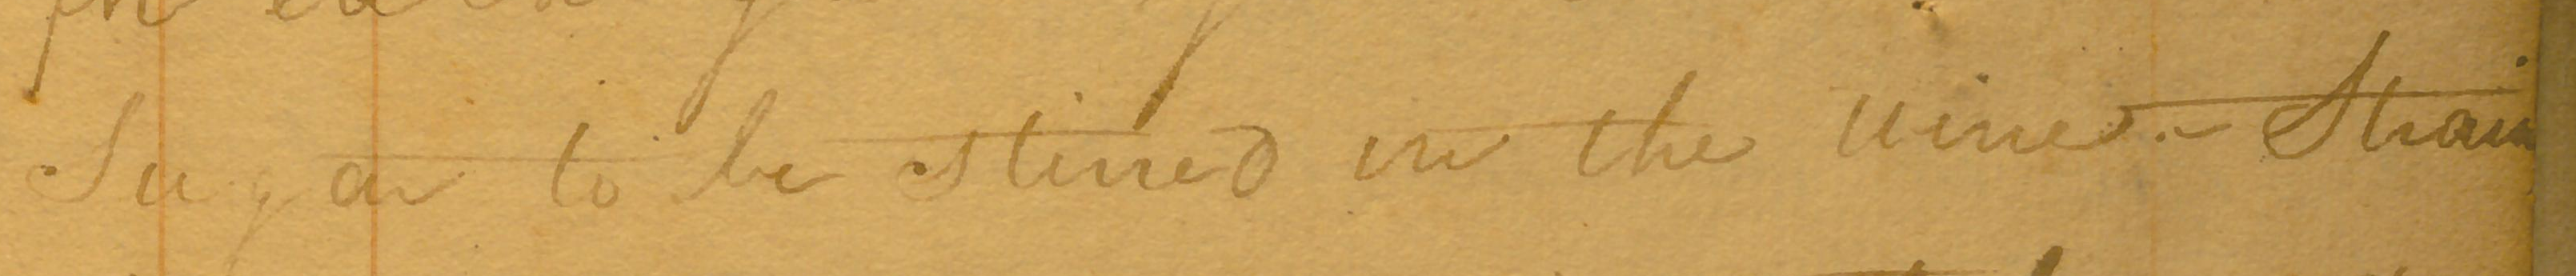Sugar to be stirred in the wine.- Strain
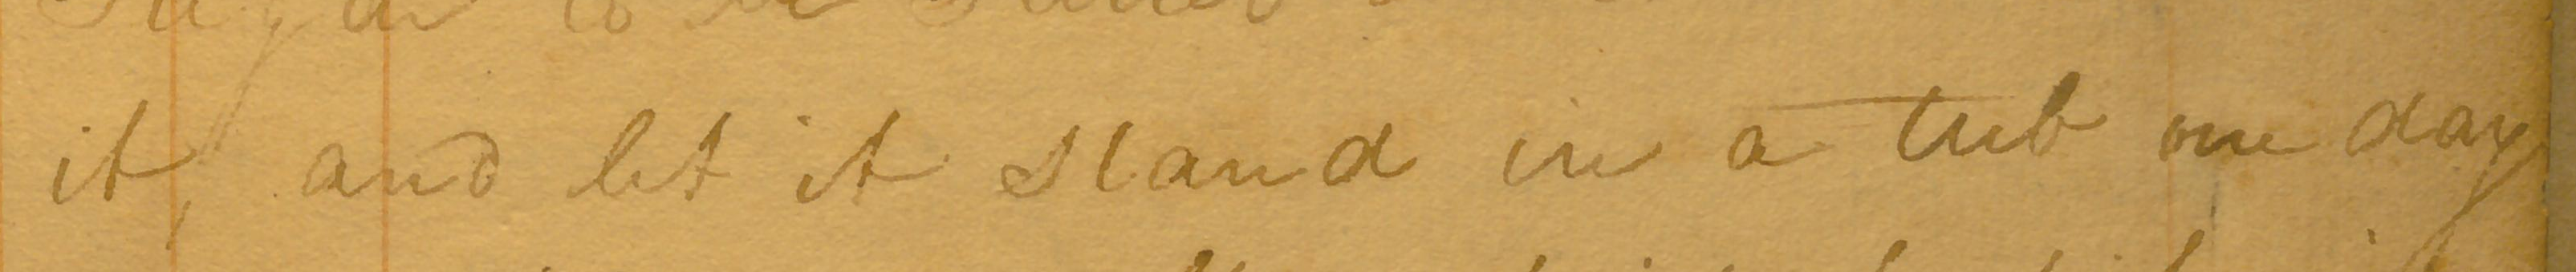it and let it stand in a tub one day
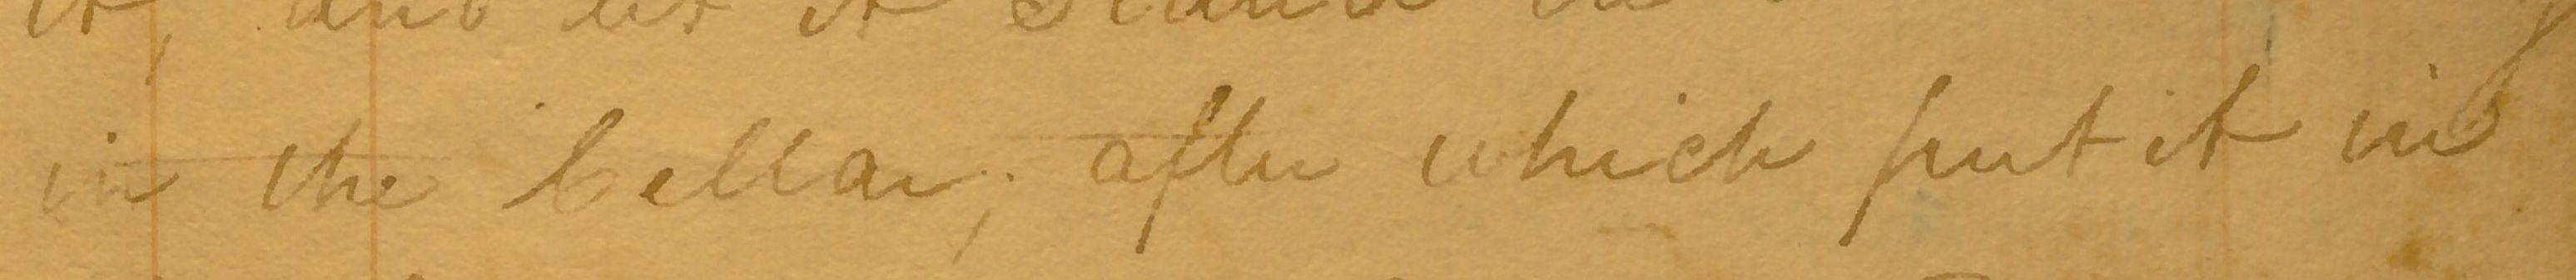in the Cellar after which put it in
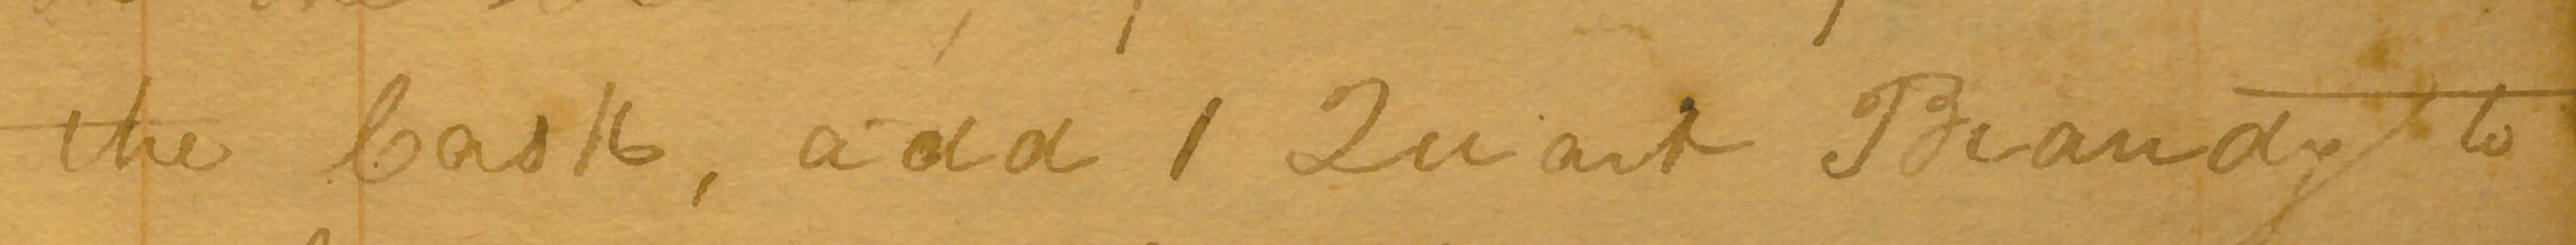the Cask, add 1 Quart Brandy to
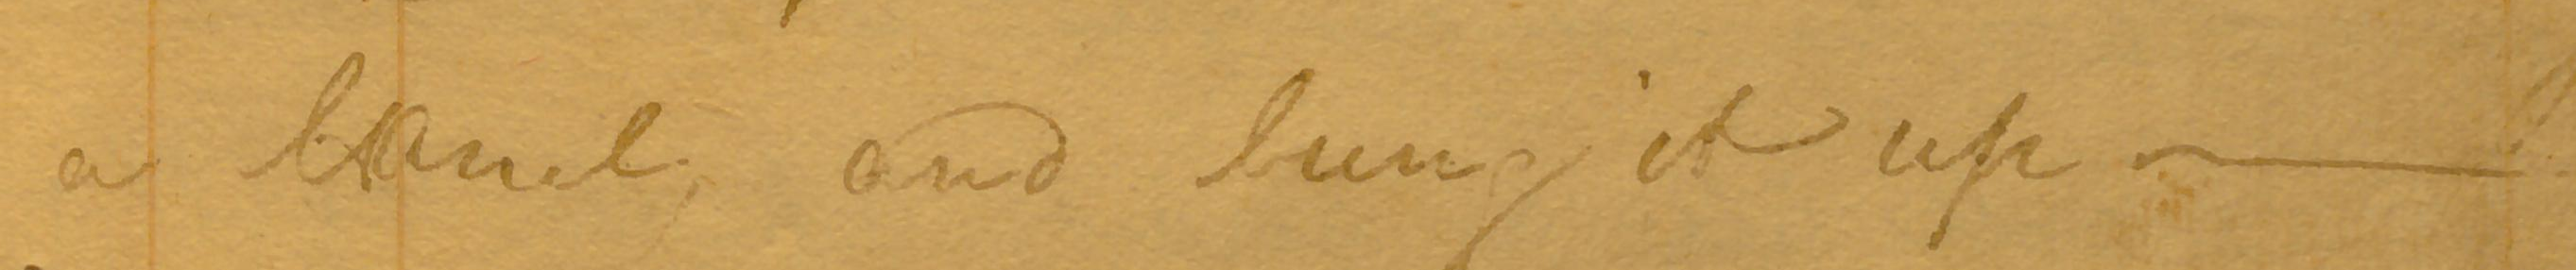a barrel, and bung it up-
